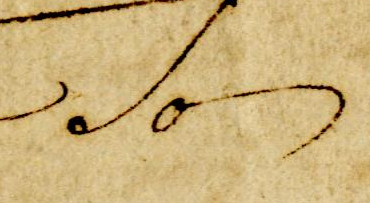To
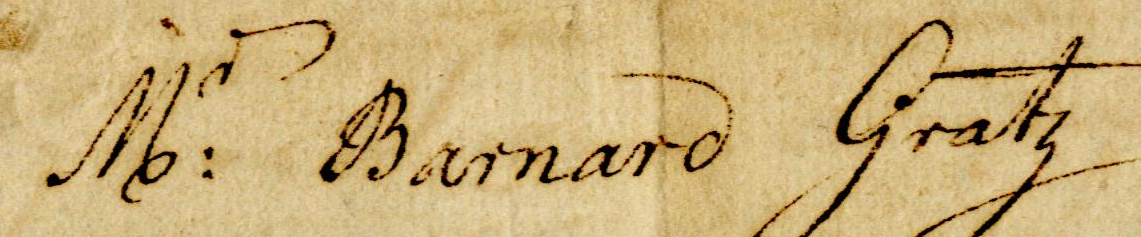M^r: Barnard Gratz
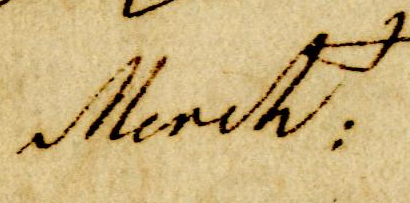Merch^t:
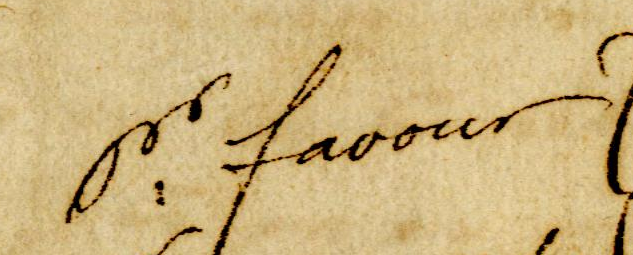p^r favour
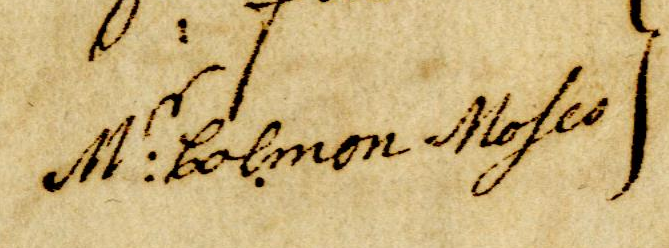M^r: Colmon Moses
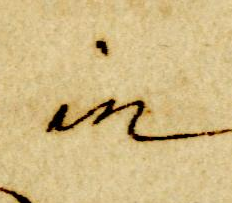in
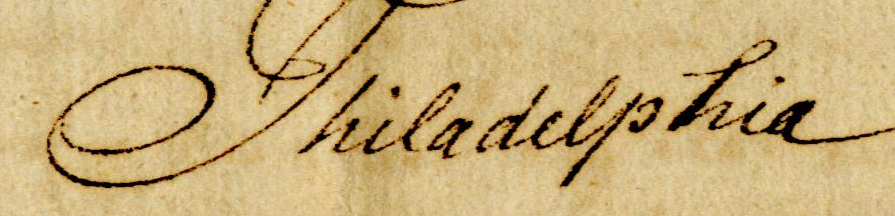Philadelphia
